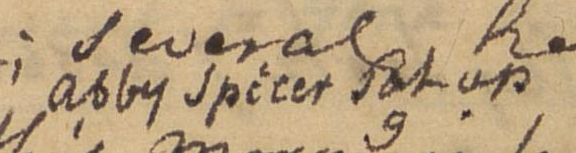Abby Spicer Sat up
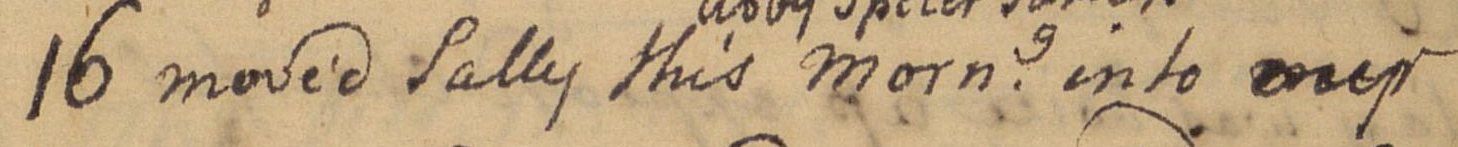16 move'd Sally this morn^g into [___]
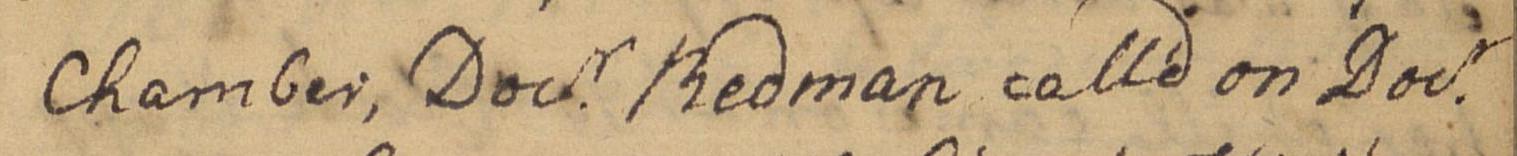Chamber, Doc^r Redman call'd on Doc^r
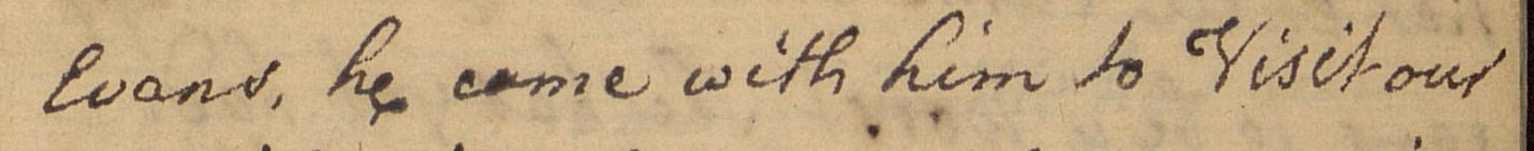Evans, he came with him to Visit our
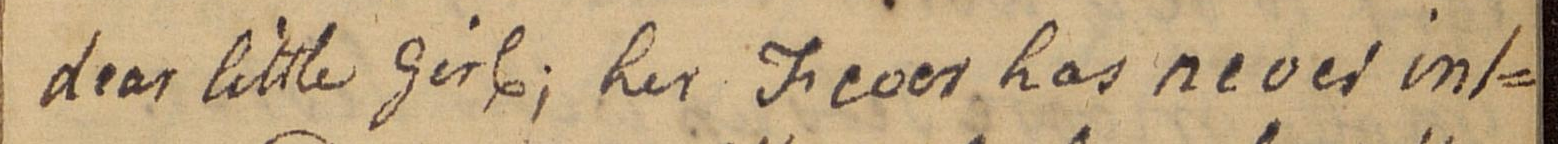dear little Girl; her Fever has never int-
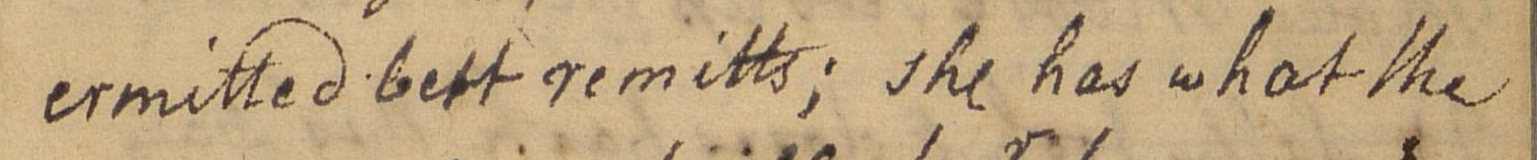ermitted bett remitts; she has what the
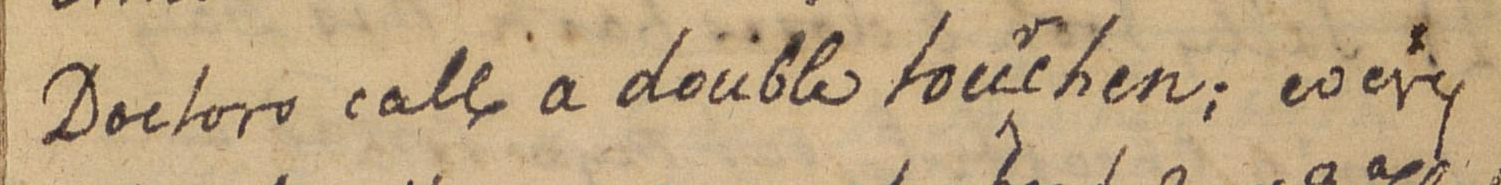Doctors call a double tou^rchen; every
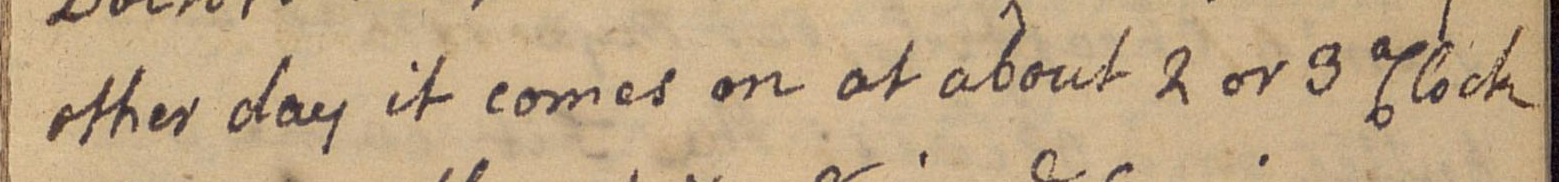other day it comes on at about 2 or 3 ^oClock
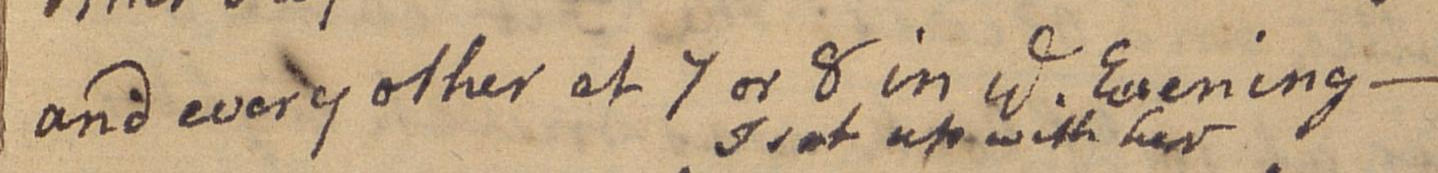and every other at 7 or 8 in y^e. Evening-
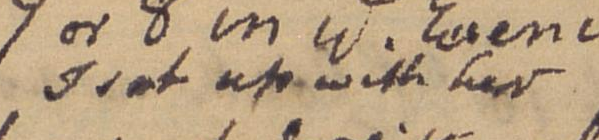I sat up with her
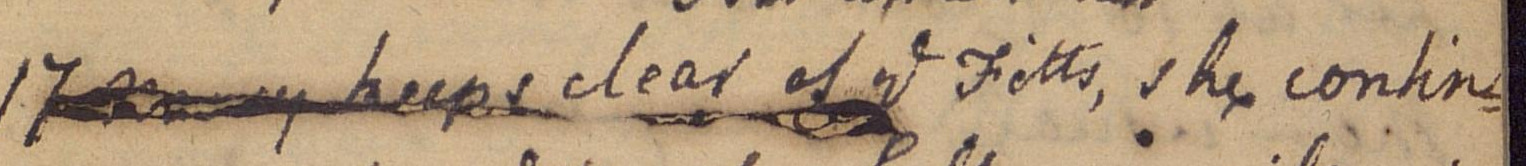17 [____] [keeps] clear of y^e Fitts, she contin-
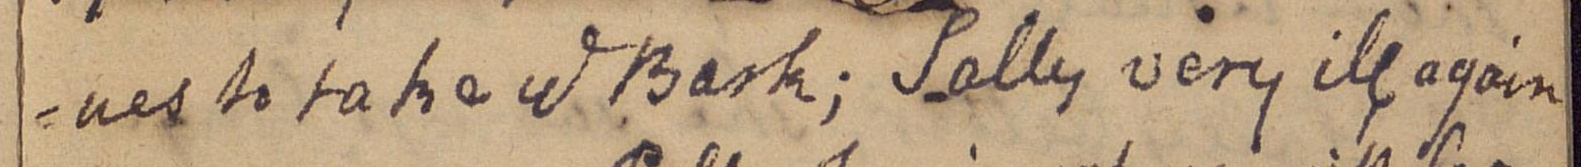-ues to take y^e Bark; Sally very ill again
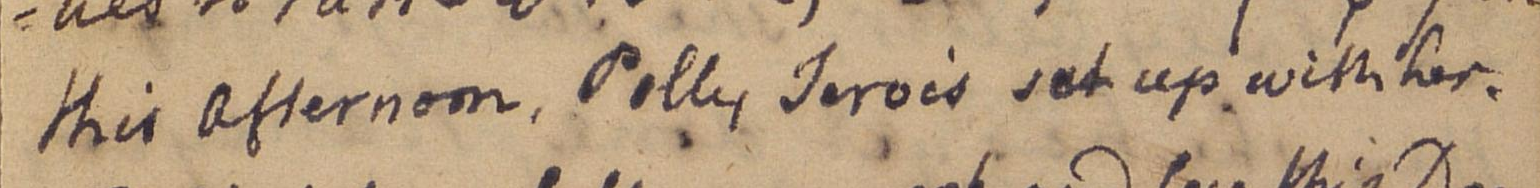this Afternoon, Polly Jervis sat up with her.
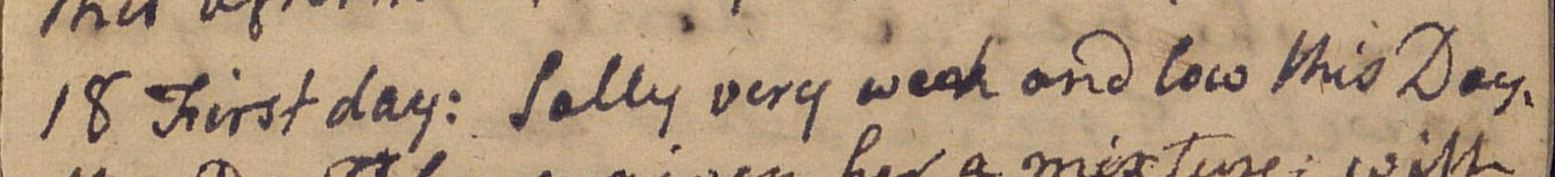18 First day: Sally very weak and low this Day.
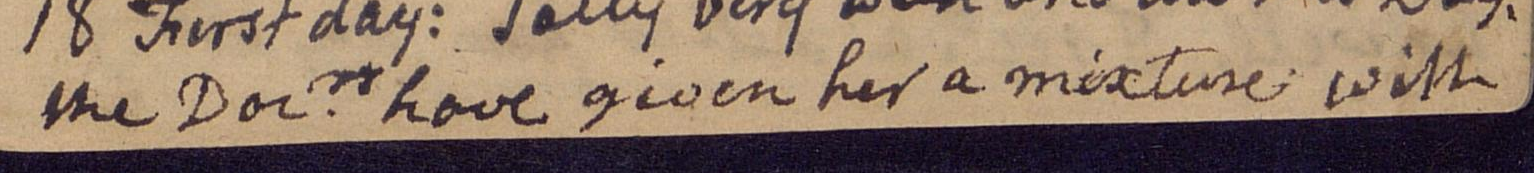the Dor^rs. have given her a mixture with
